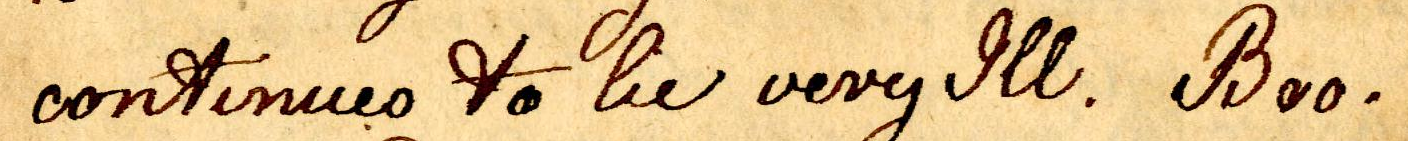continues to lie very Ill. Bro.
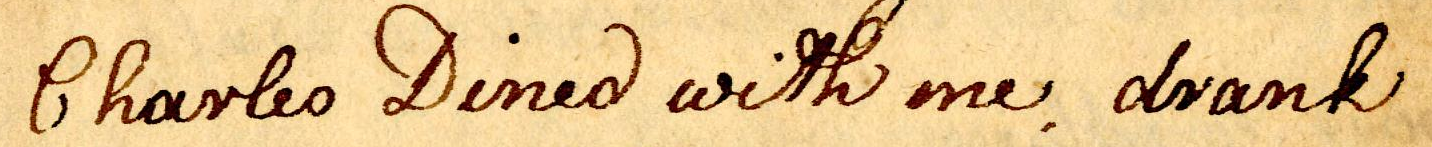Charles Dined with me drank
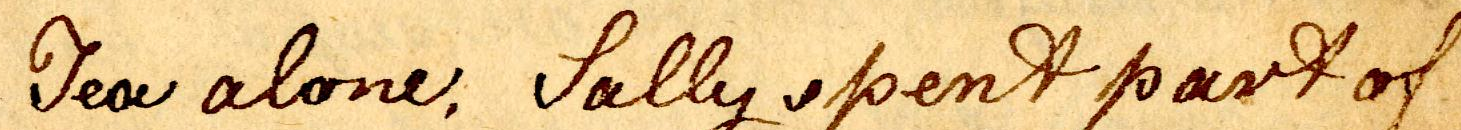Tea alone, Sally spent part of
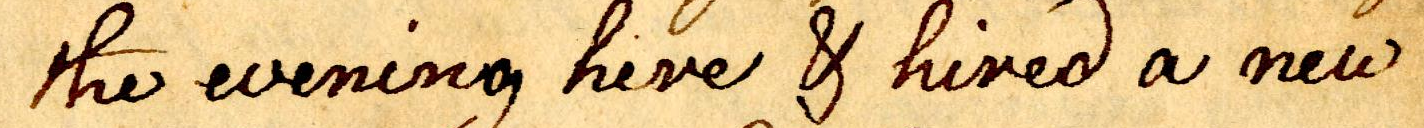the evening here & hired a new
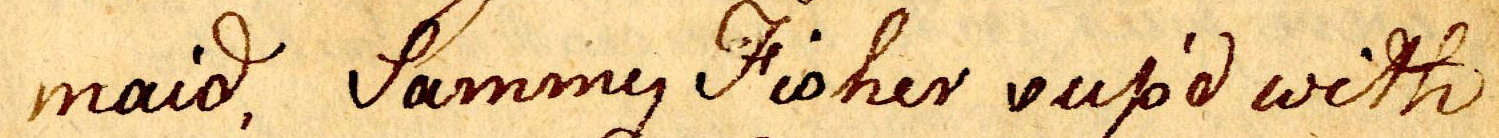maid, Sammy Fisher sup'd with
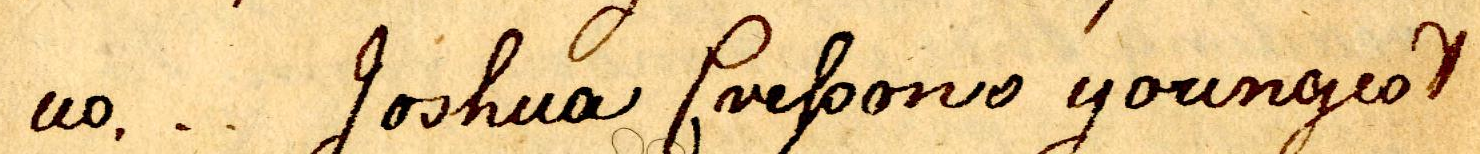us. . . Joshua Cressons youngest
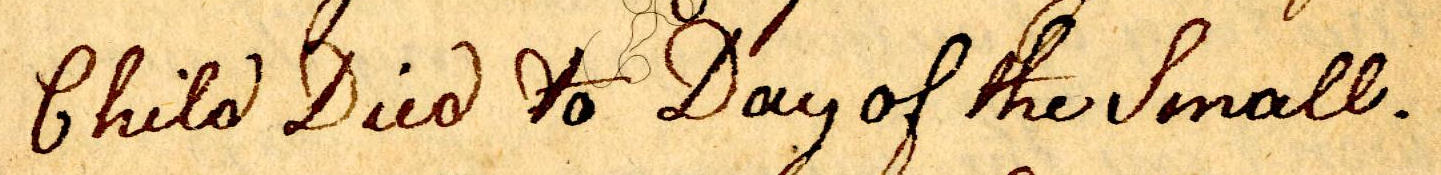Child Died to Day of the Small.
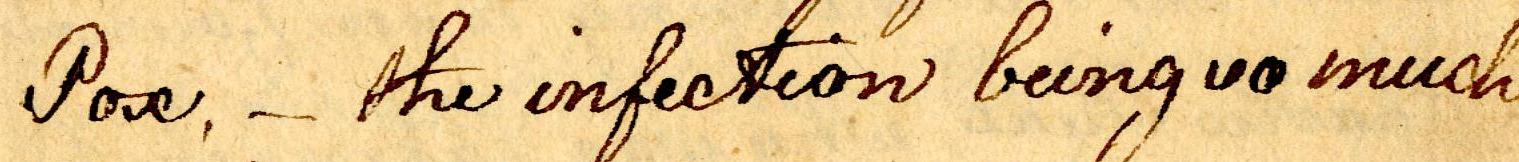Pox, - the infection being so much
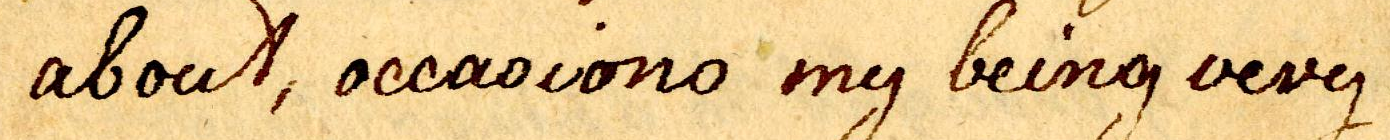about, occasions my being very
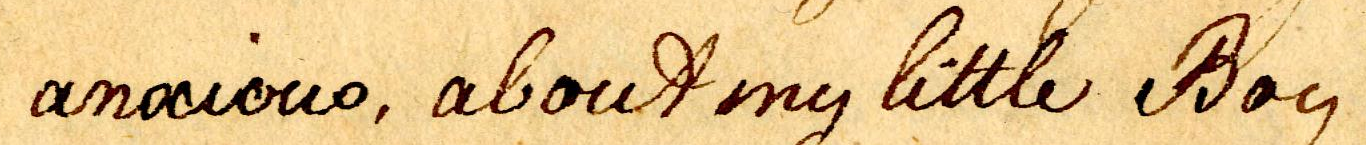anxious, about my little Boy
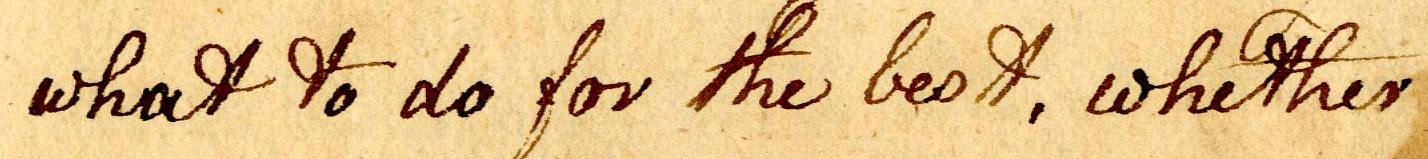what to do for the best, whether
